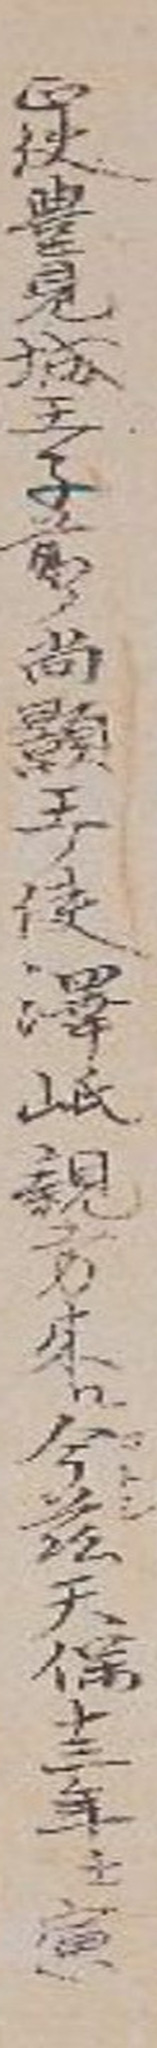正使豊見城王子前ノ尚顥王ノ使沢岻親方来ル今茲天保十三年壬寅
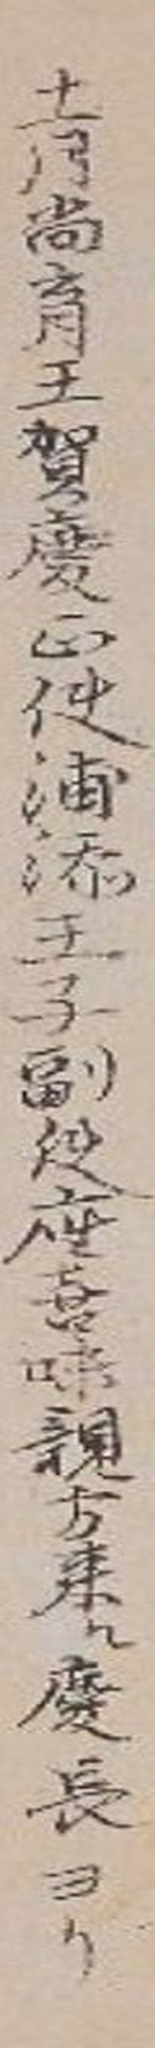十一月尚育王賀慶正使浦添王子副使座喜味親方来ル慶長ヨリ
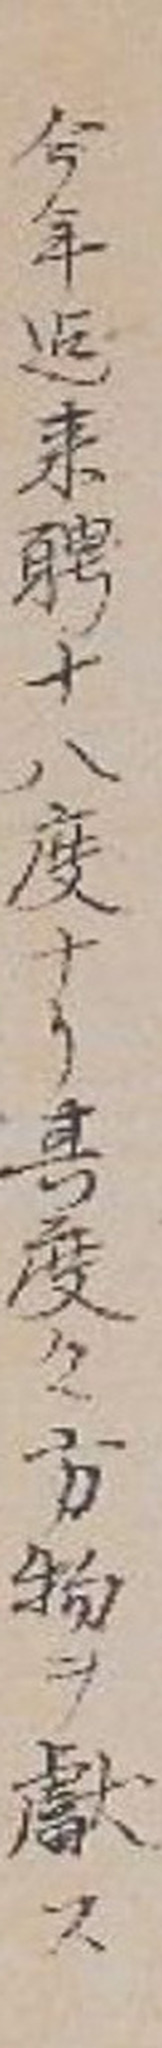今年迄来聘十八度ナリ其度々方物ヲ献ス
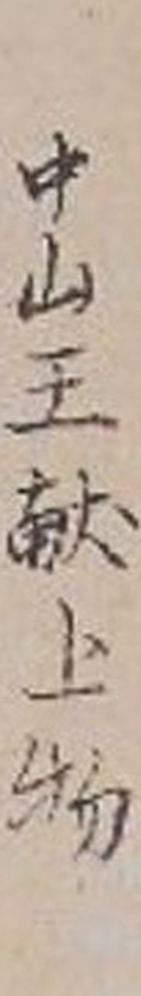中山王献上物
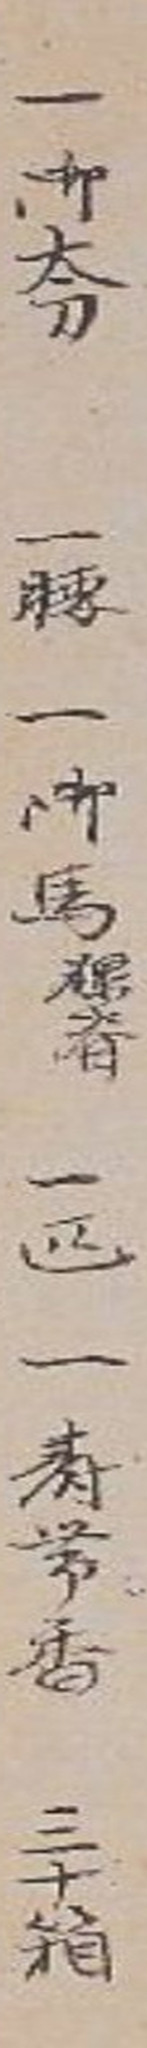一御太刀一腰一御馬裸背一匹一寿帯香三十箱
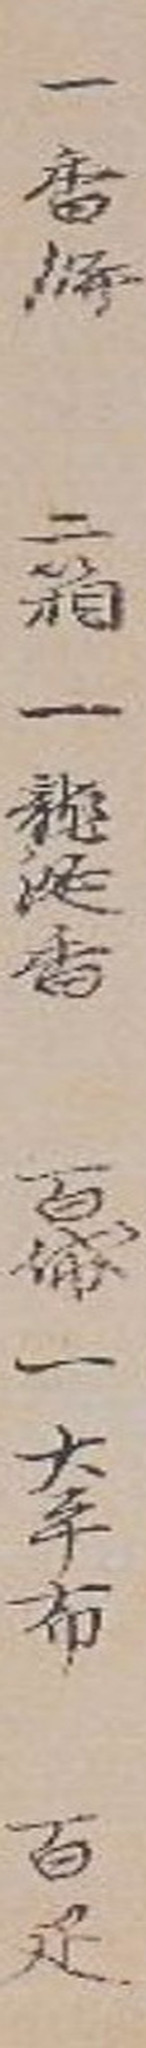一香餅二箱一龍涎香百袋一大平布百疋
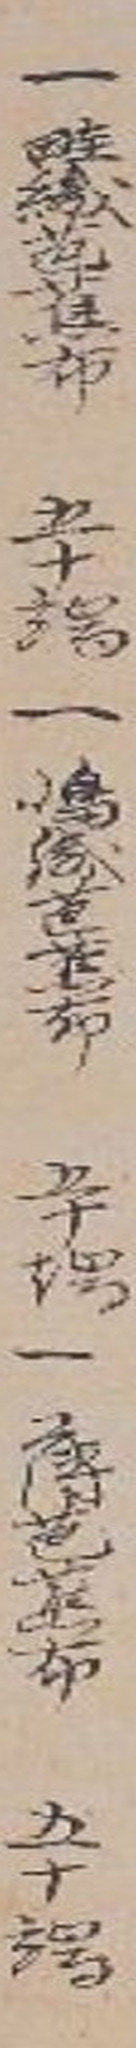一畦織芭蕉布五十端一島織芭蕉布五十端一薩芭蕉布五十端

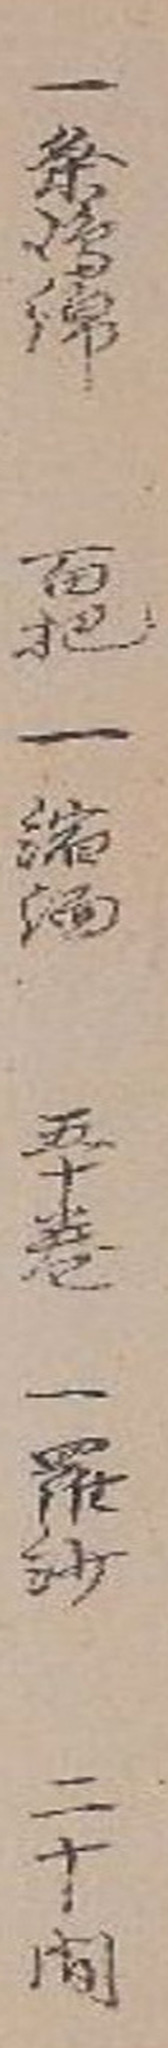一条島綿百把一縮緬五十巻一羅紗二十間
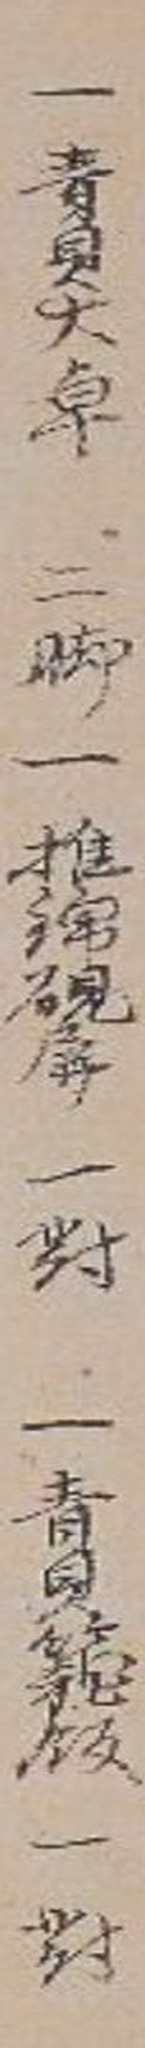一青貝大卓二脚一推錦硯屏一対一青貝籠飯一対
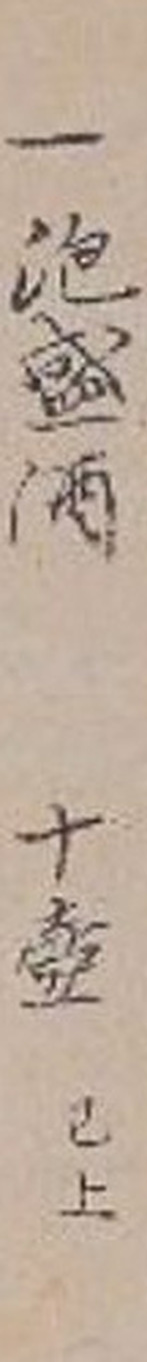一泡盛酒十壺已上
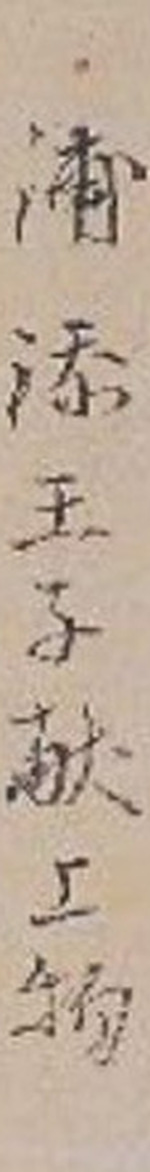浦添王子献上物
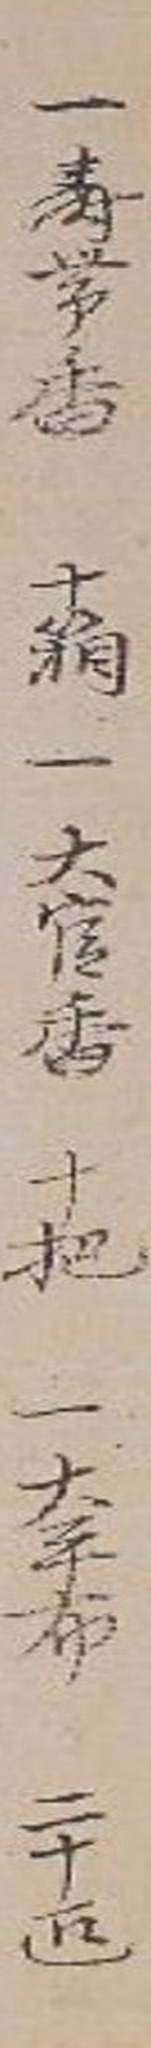一寿帯香十箱一大官香十把一大平布二十匹
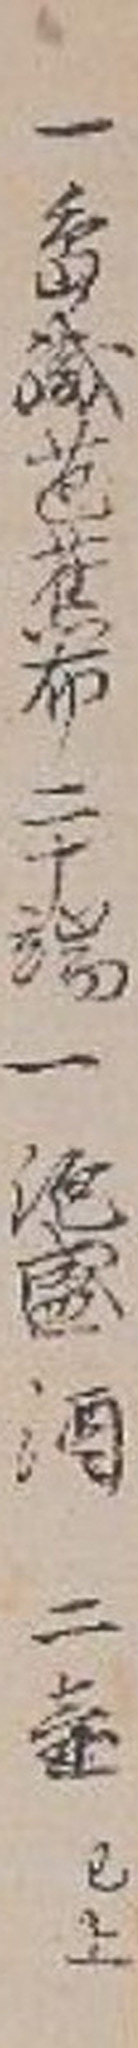一島織芭蕉布二十端一泡盛酒ニ壺已上
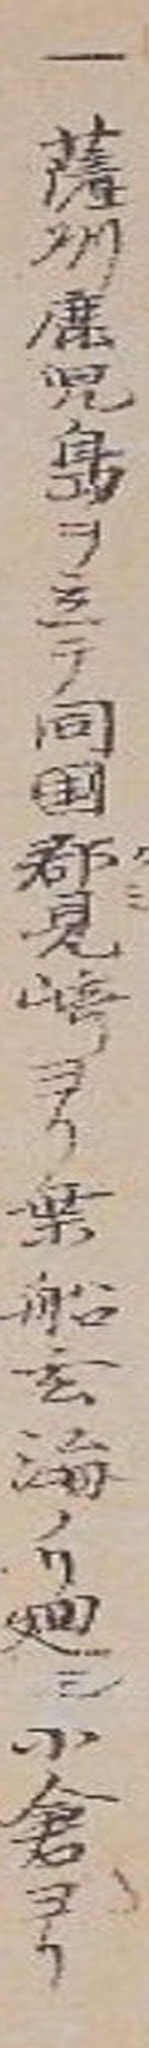一薩州鹿児島ヲ立テ同国郡見崎ヨリ乗船玄海ノリ廻シ小倉ヨリ
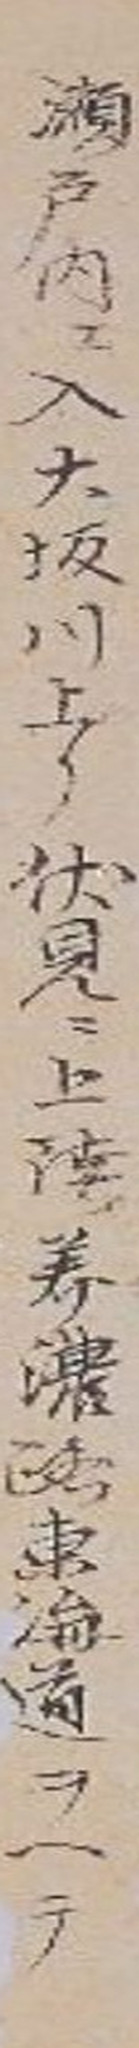瀬戸内エ入大坂川上リ伏見ニ上陸美濃路東海道ヲヘテ
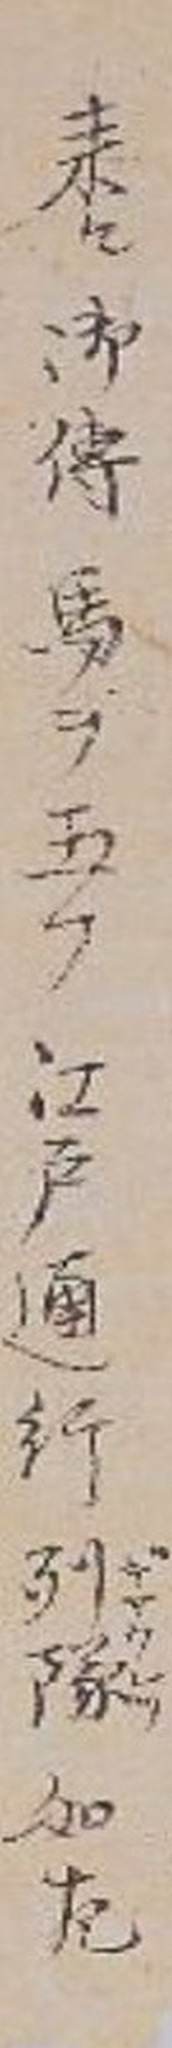来ル御伝馬ヲ玉フ江戸通行隊列如左
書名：琉球来聘志(仮) 天保十三年
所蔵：University of the Ryukyus Library
